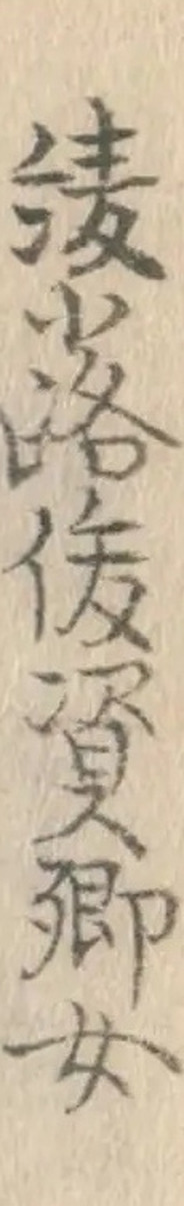綾小路俊資卿女

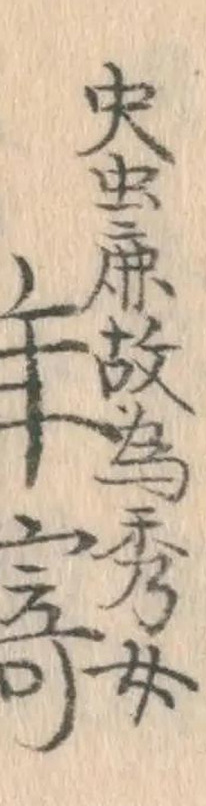史虫鹿故為秀女
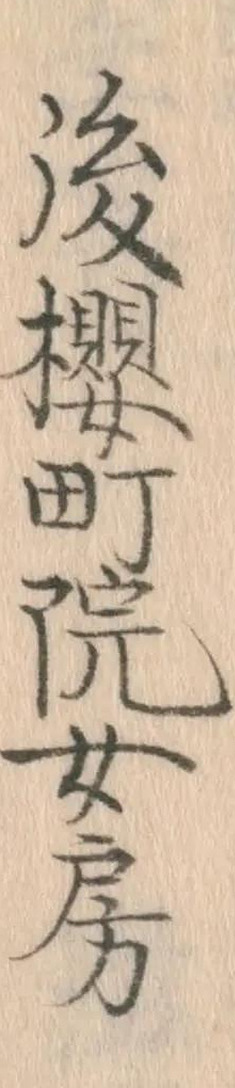後桜町院女房
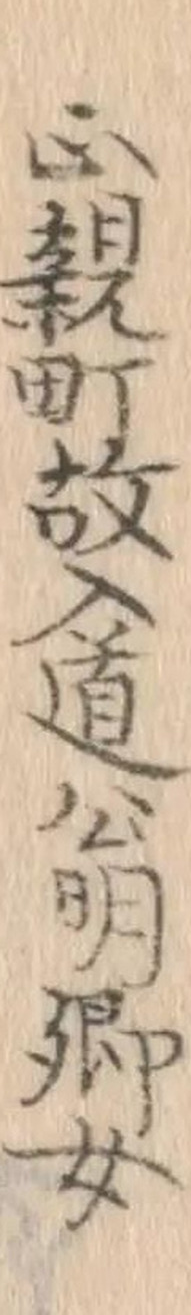正親町故入道公明卿女
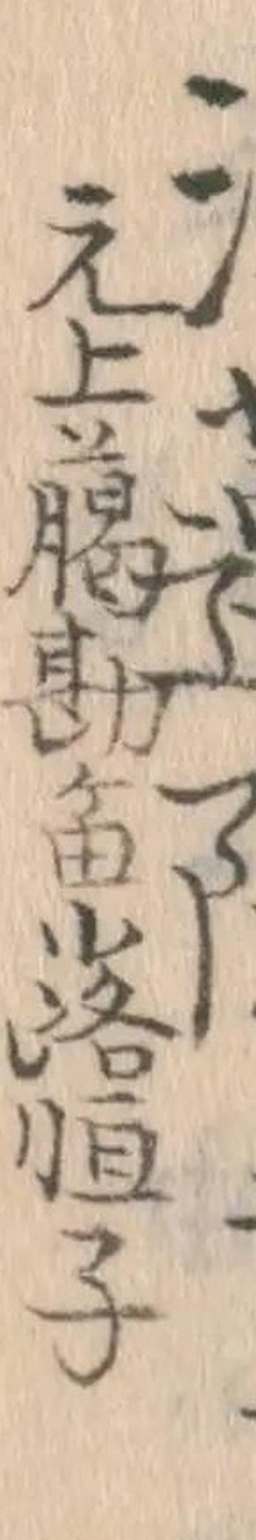元上臈勘ケ由小路恒子
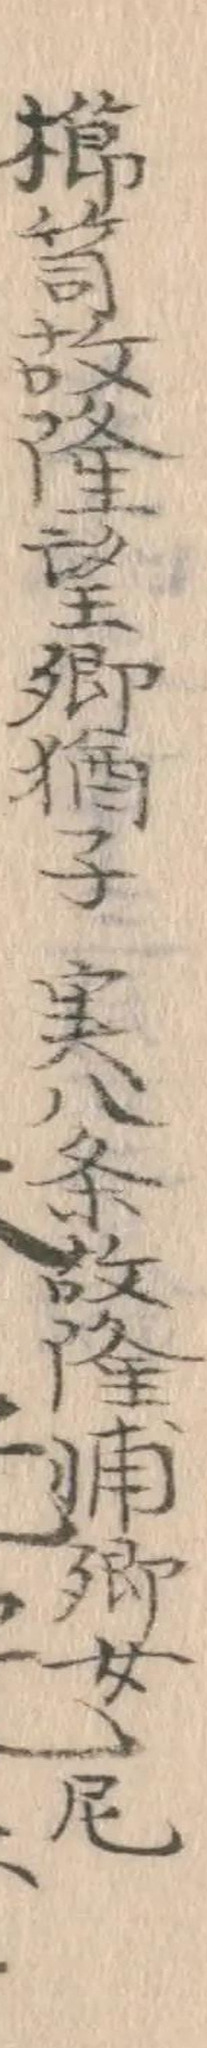櫛笥故隆望卿猶子実八条故隆輔卿女尼
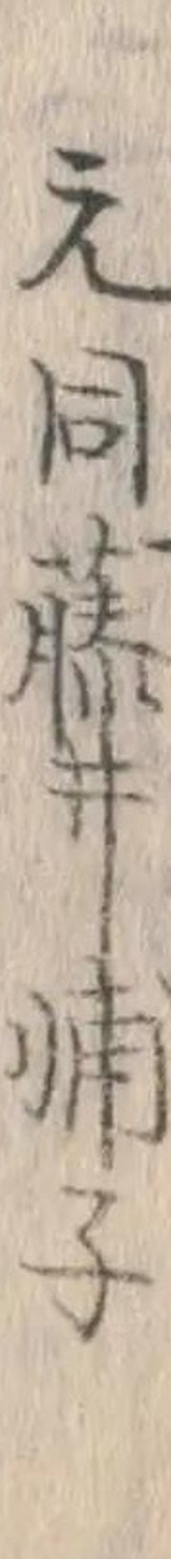元同藤井輔子
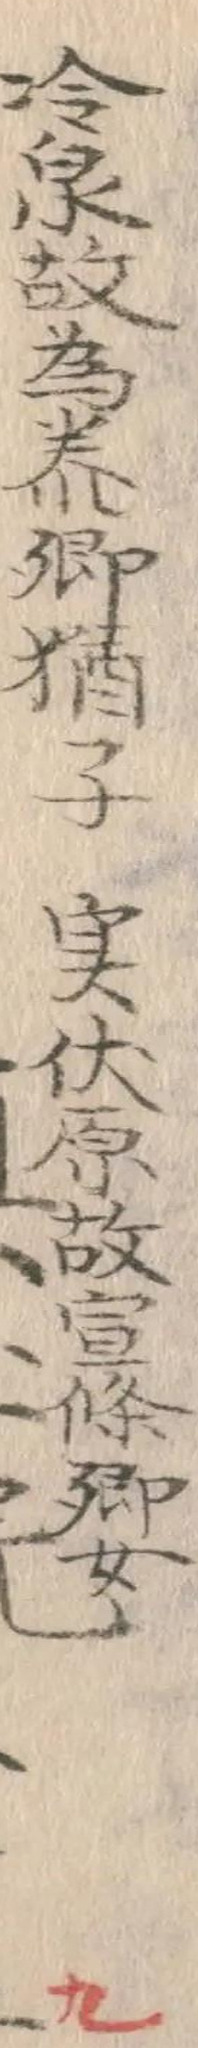冷泉故為泰卿猶子実伏原故宣条卿女
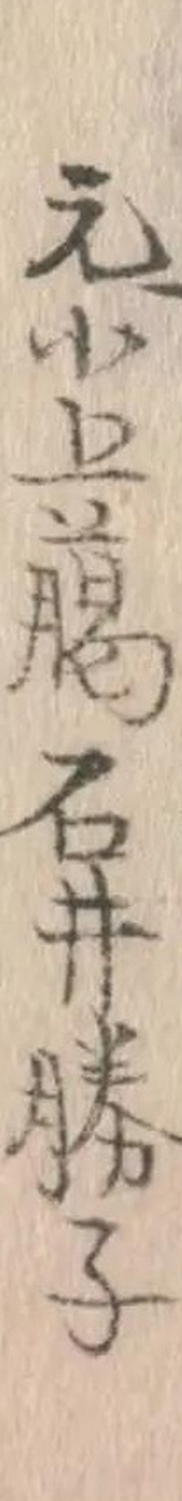元小上臈石井勝子
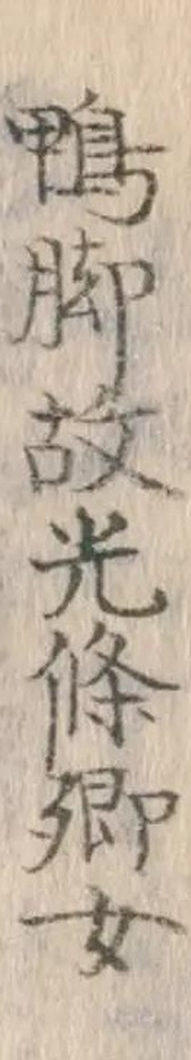鴨脚故光条卿女
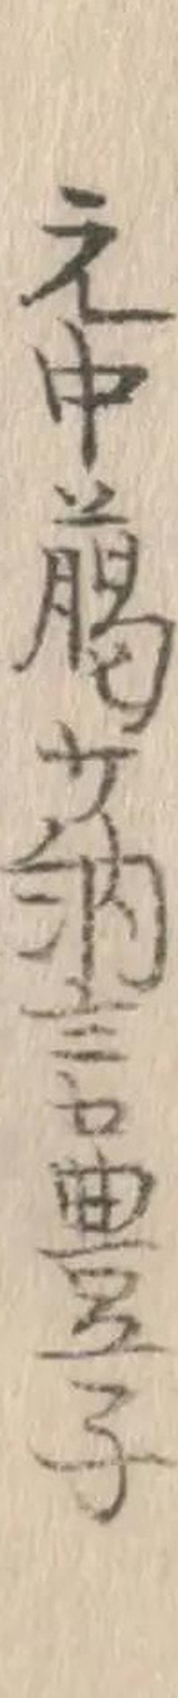元中臈少納言豊子
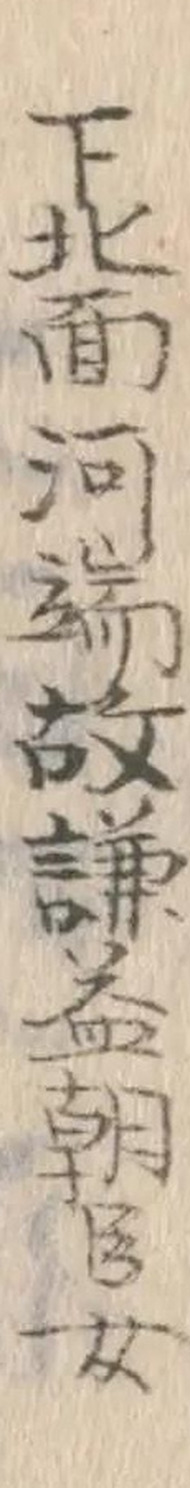下北面河端故謙益朝臣女
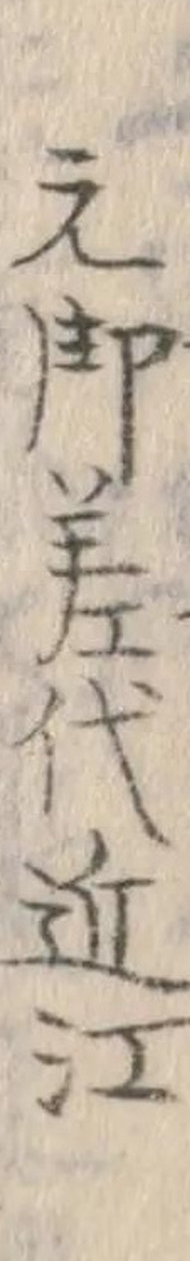元御差代近江
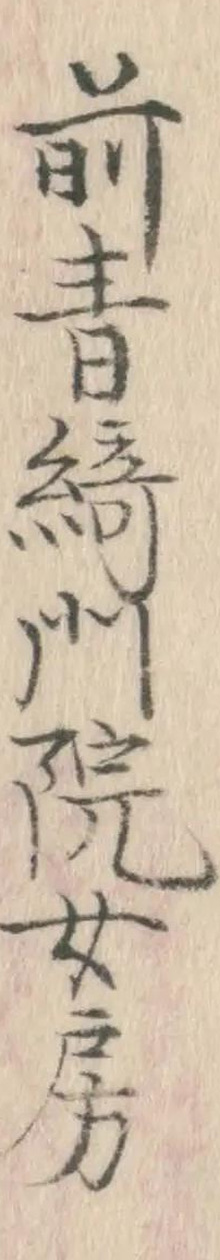前青綺門院女房
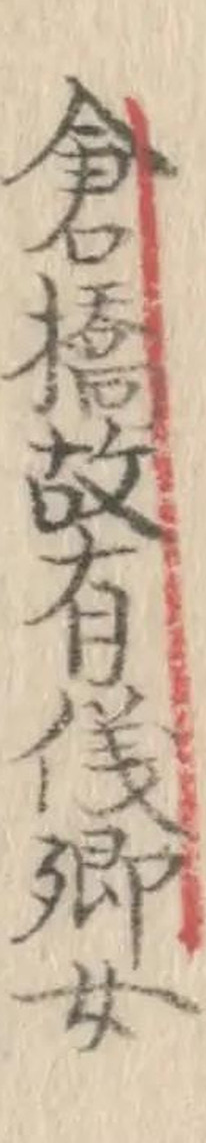倉橋故有儀卿女
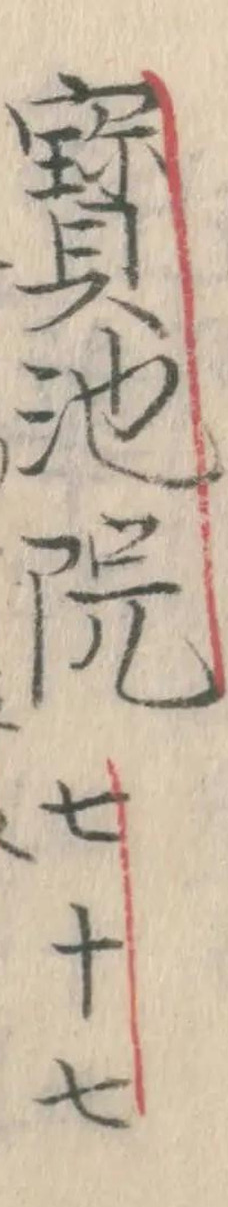宝池院七十七
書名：賀茂社記録. 第80冊
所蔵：国立国会図書館 National Diet Library, JAPAN
